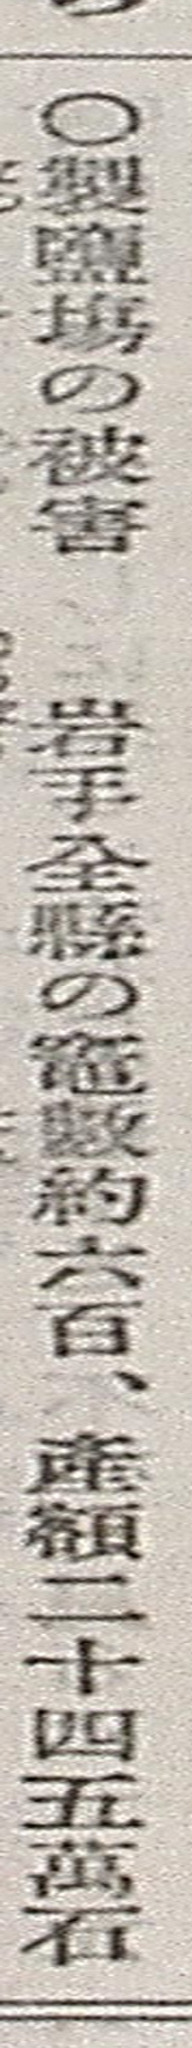○製塩場の被害岩手全県の竈数約六百、産額二十四五万石
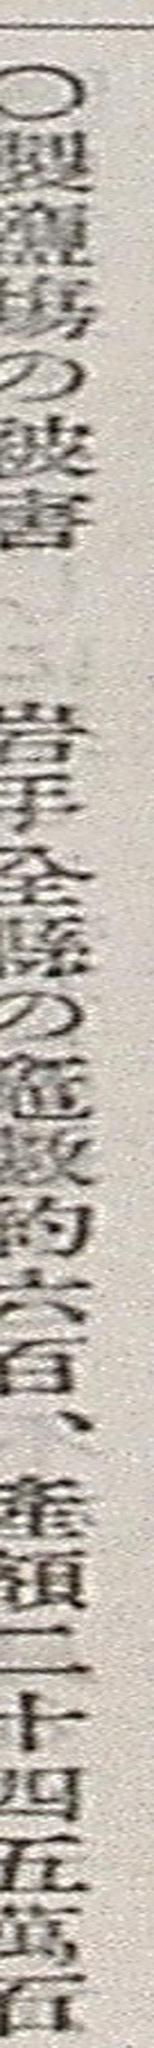○製塩場の被害岩手全県の竈数約六百、産額二十四五万石
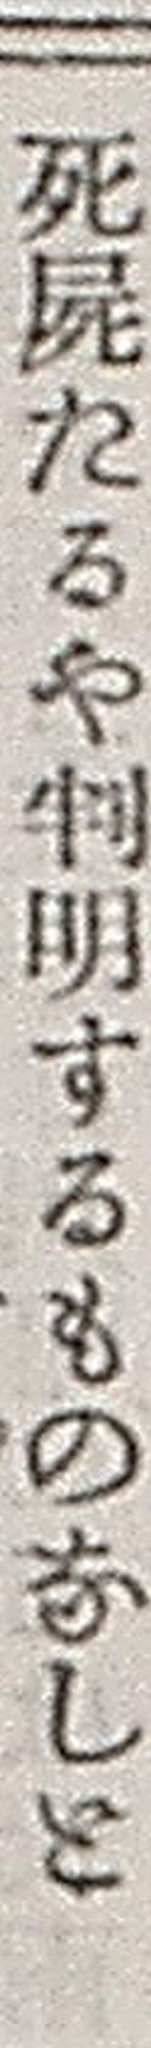死屍たるや判明するものなしと
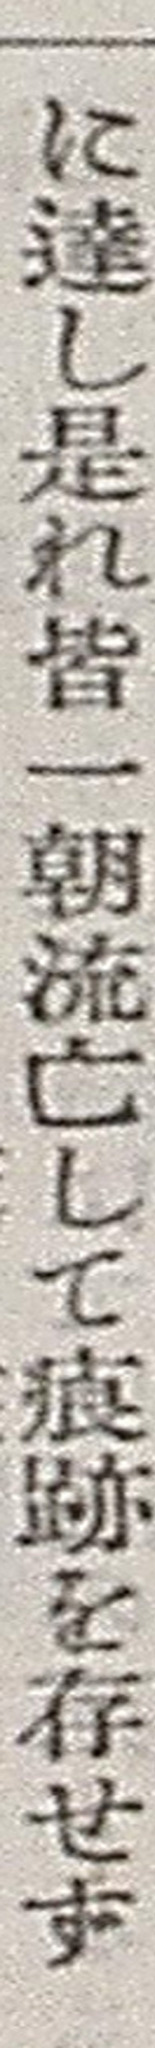に達し是れ皆一朝流亡して痕跡を存せず
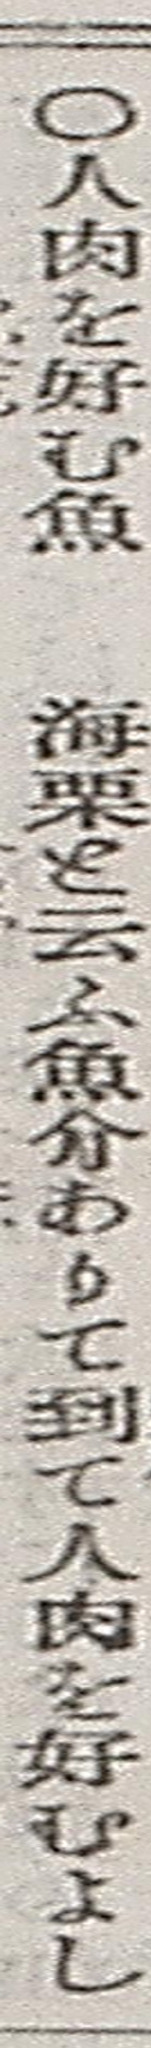○人肉を好む魚海栗と云ふ魚介ありて到て人肉を好むよし
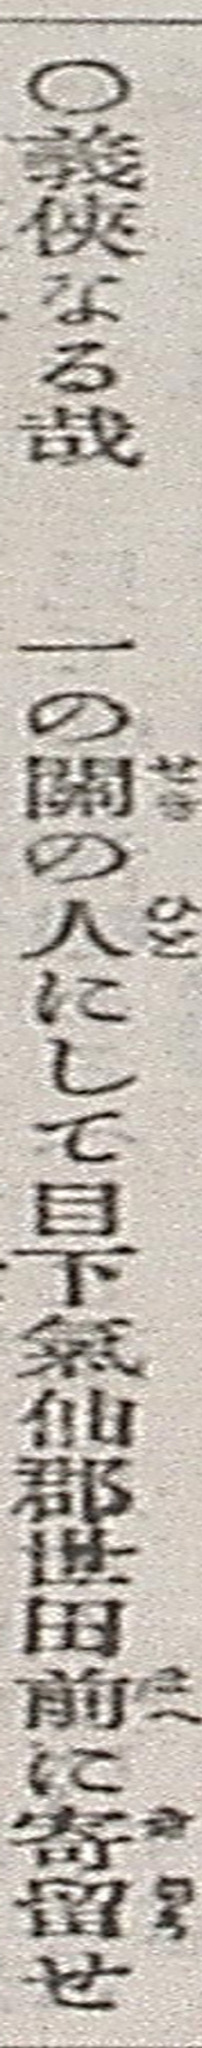○義侠なる哉一の関の人にして目下気仙郡世田前に寄留せ
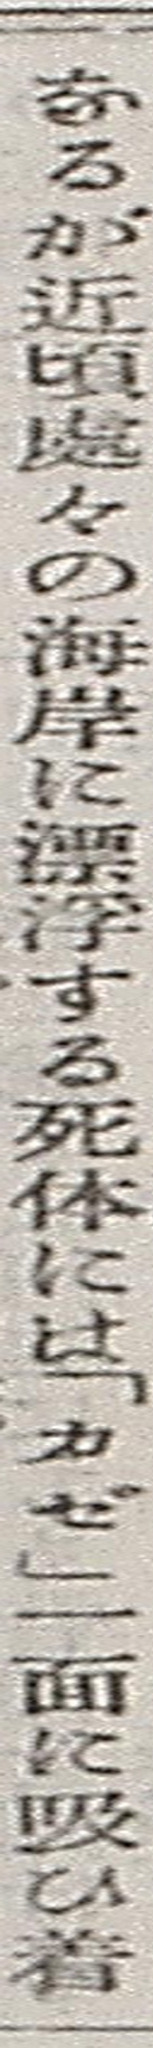なるが近頃処々の海岸に漂浮する死体には「カゼ」一面に吸ひ着
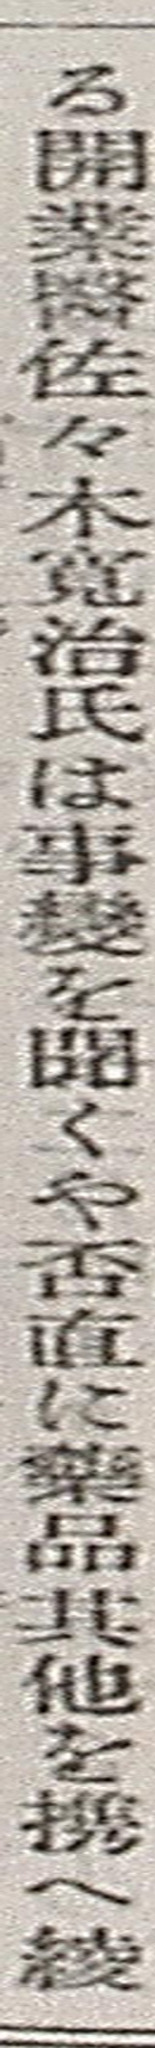る開業医佐々木寛治氏は事変を聞くや否直に薬品其他を携へ綾
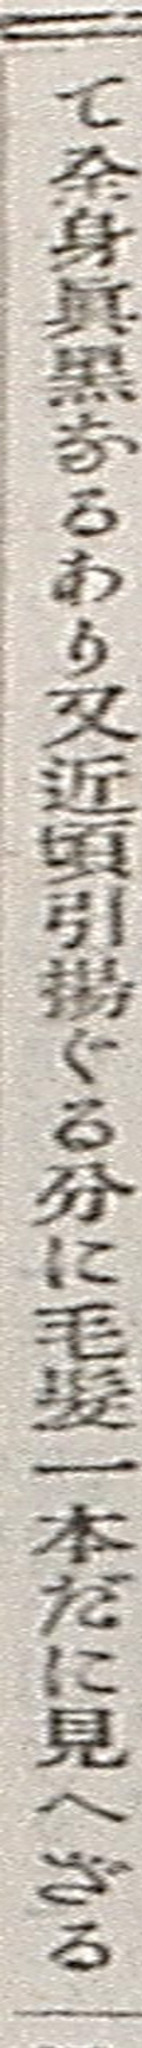て全身真黒なるあり又近頃引揚ぐる分に毛髪一本だに見へざる
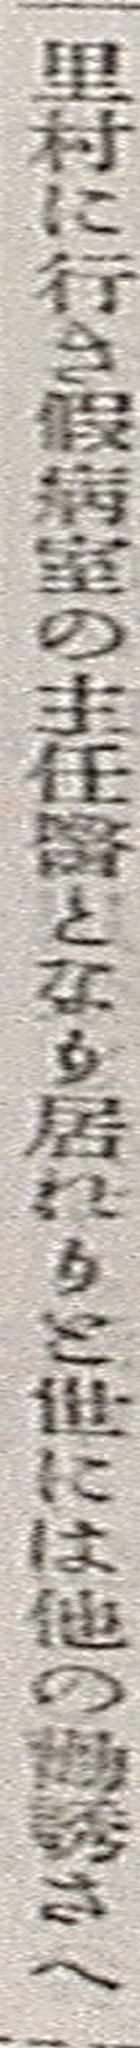里村に行き仮病室の主任医となり居れりと世には他の勧誘さへ

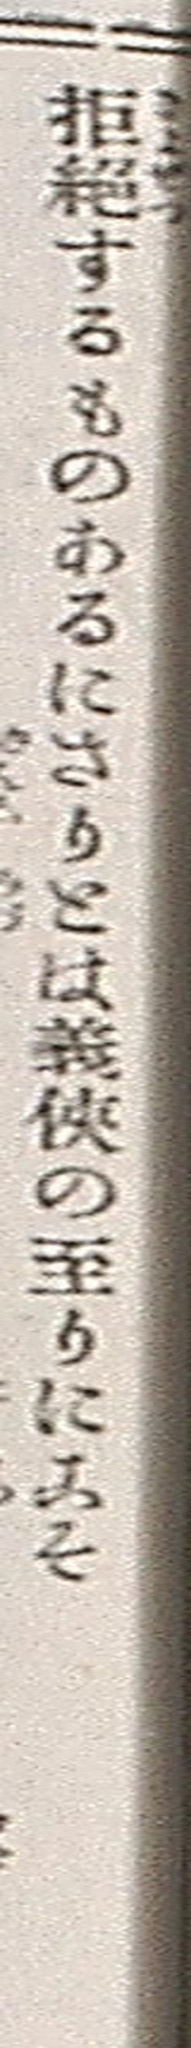拒絶するものあるにさりとは義侠の至りにこそ
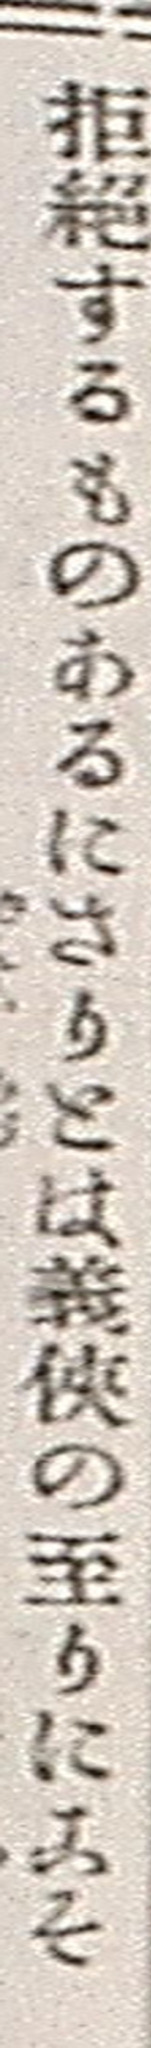拒絶するものあるにさりとは義侠の至りにこそ
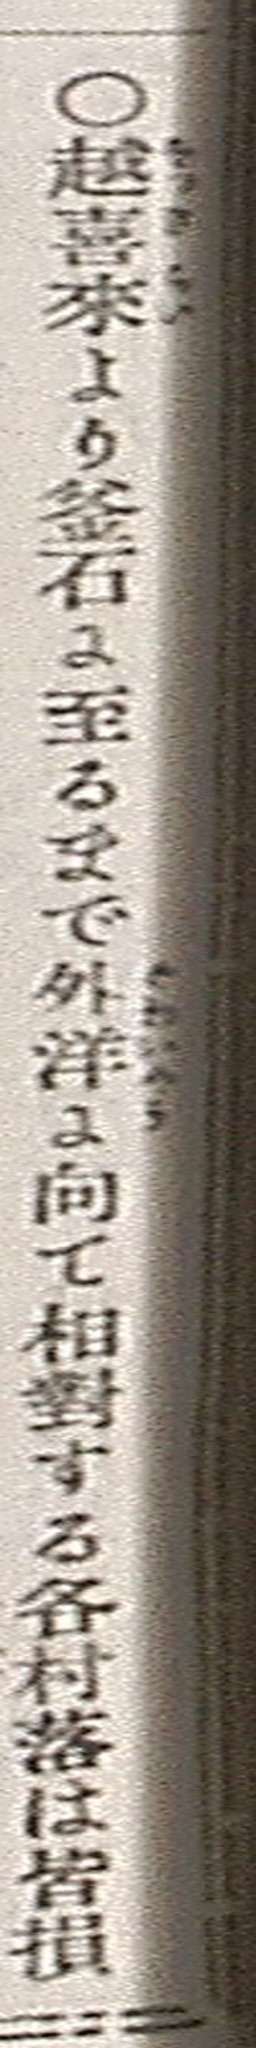○越喜来より釜石に至るまで外洋に向て相対する各村落は皆損
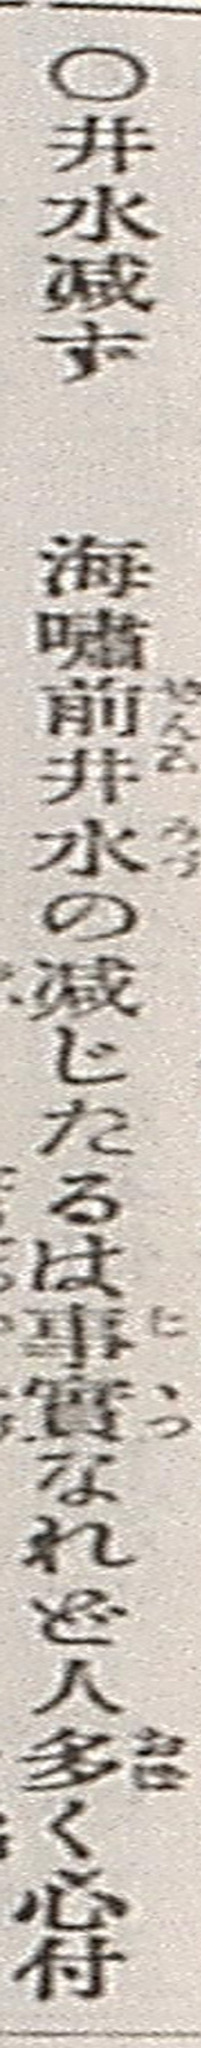○井水減ず海嘯前井水の減じたるは事実なれど人多く心付
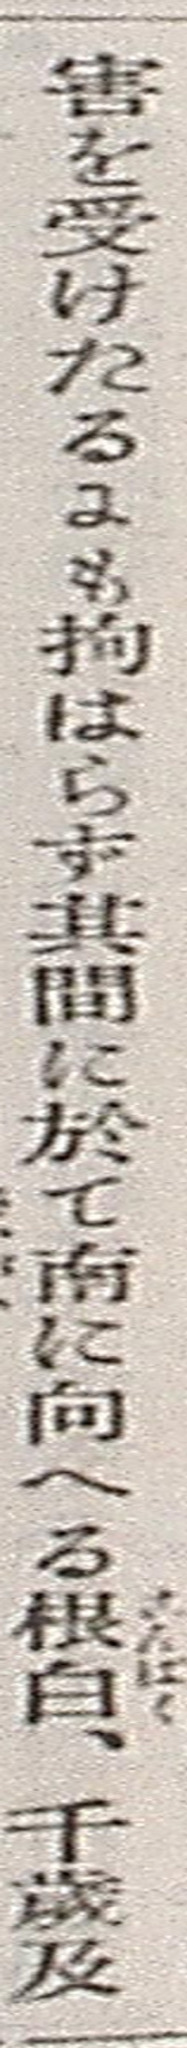害を受けたるにも拘はらず其間に於て南に向へる根白、千歳及
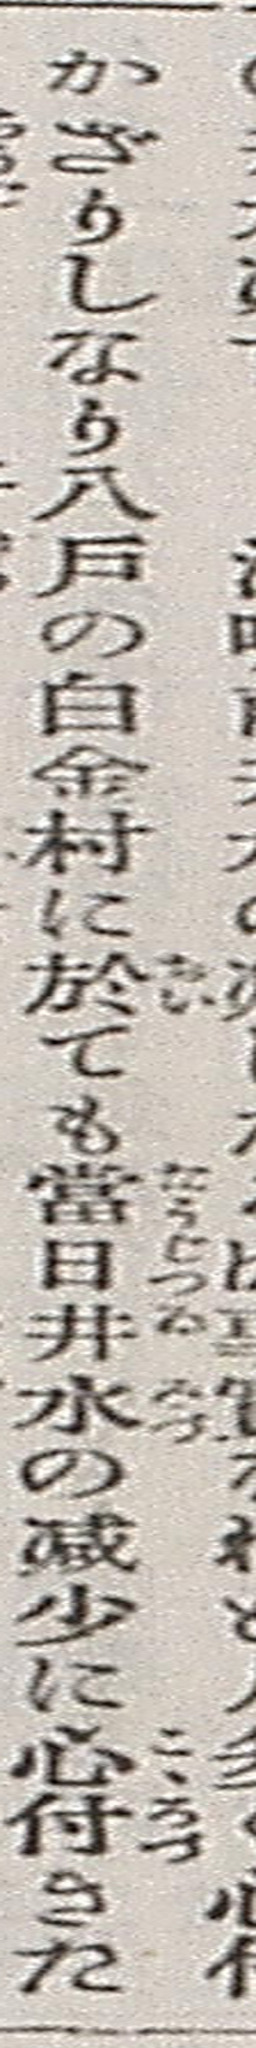かざりしなり八戸の白金村に於ても当日井水の減少に心付きた
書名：風俗畫報臨時増刊第百二十號　大海嘯被害録（下）
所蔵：東京大学地震研究所図書室 Earthquake Research Institute Library, The University of Tokyo, JAPAN
